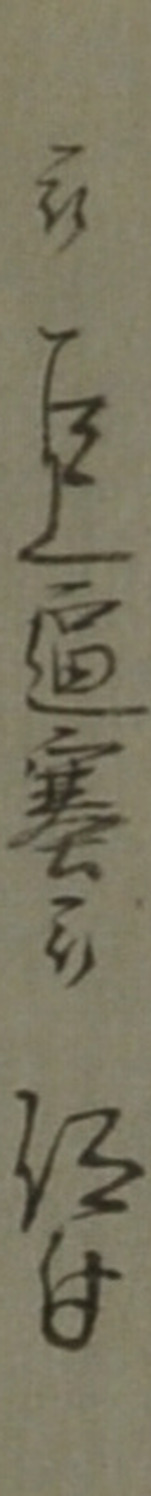被召上逼塞被仰付
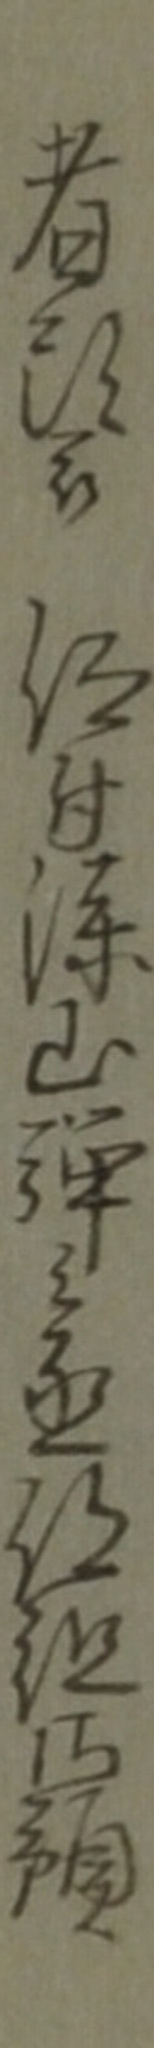者頭被仰付津山弾之丞跡組御預
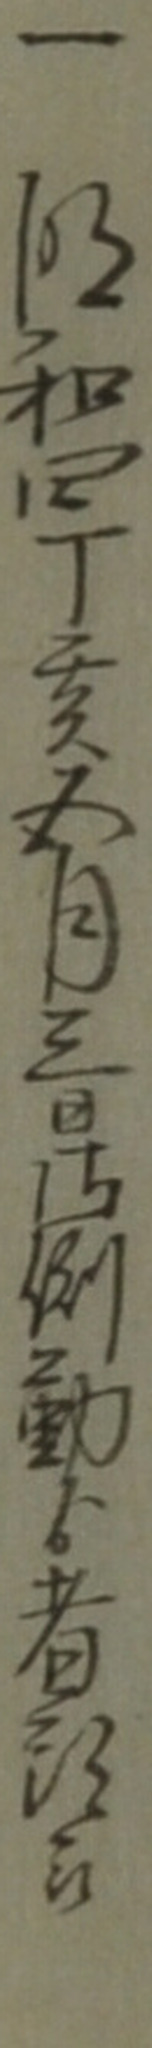一明和四丁亥五月三日御側勤ゟ者頭被
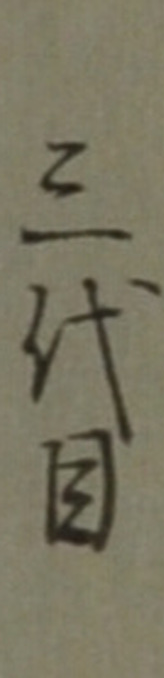三代目
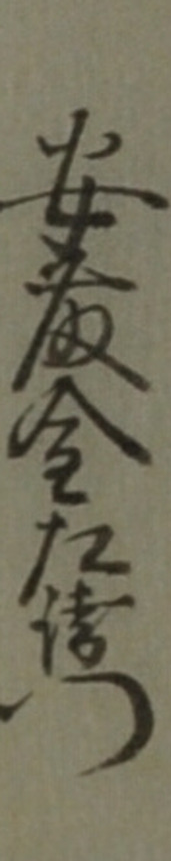安藤金左衛門
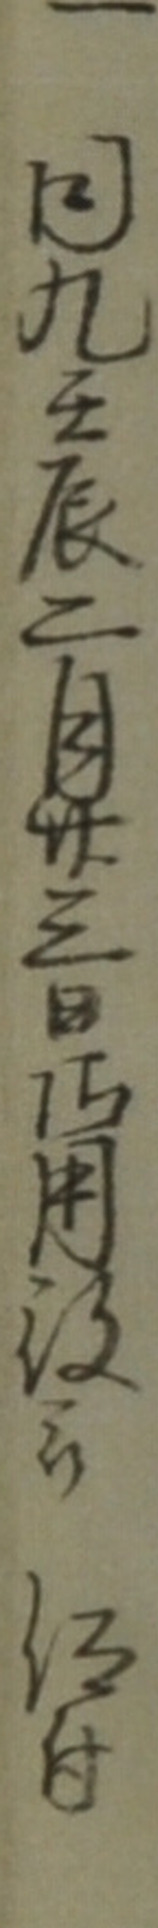一同九壬辰二月廿三日御用役被仰付
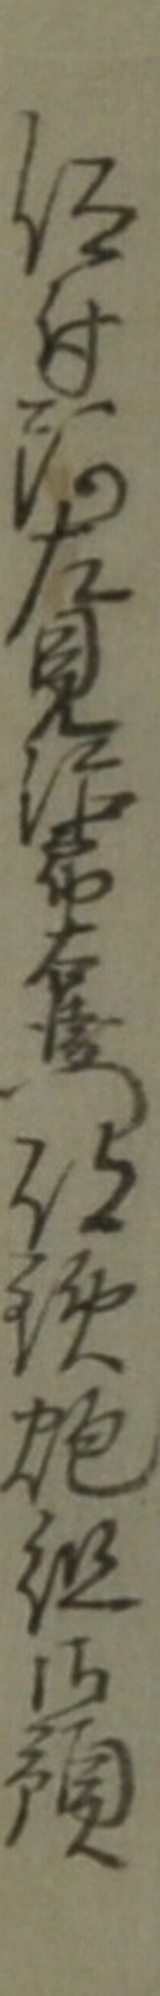仰付阿左見治郎右衛門跡鉄炮組御預

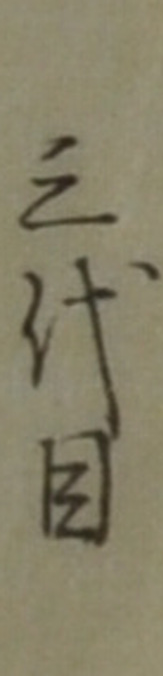三代目
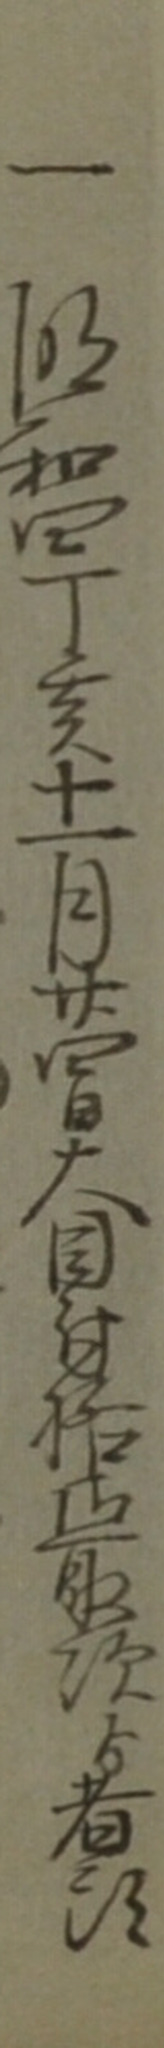一明和四丁亥十一月廿四日大目付格御取次ゟ者頭
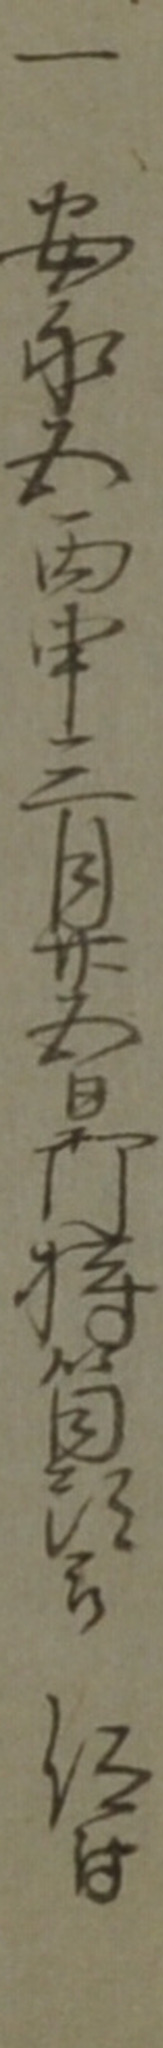一安永五丙申三月廿五日御持筒頭被仰付
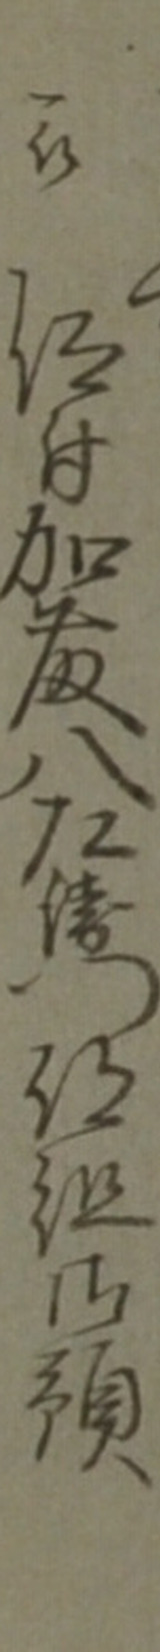被仰付加藤八左衛門跡組御預
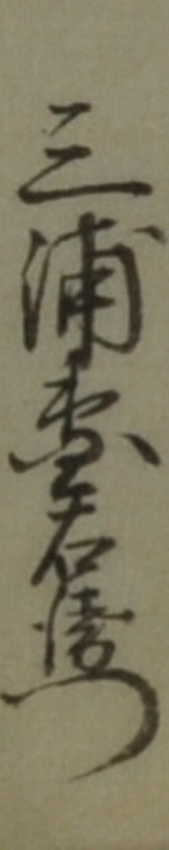三浦団右衛門
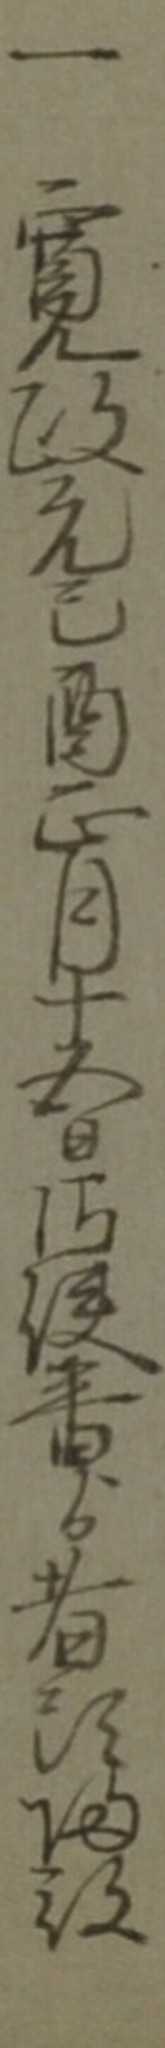一寛政元己酉正月十五日御使番ゟ者頭帰役
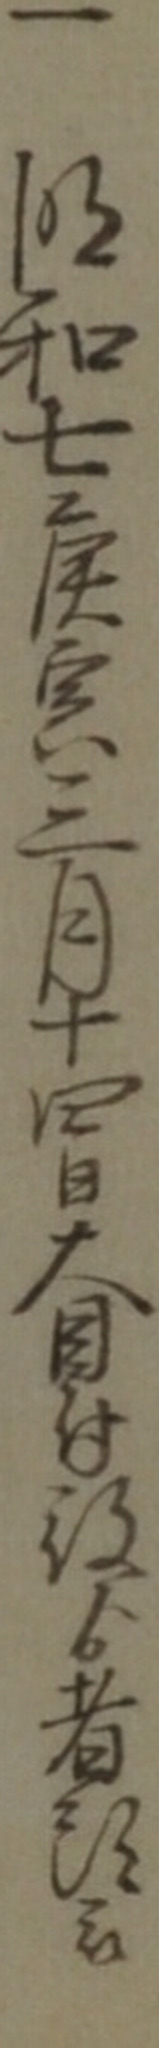一明和七庚寅三月十四日大目付役ゟ者頭被
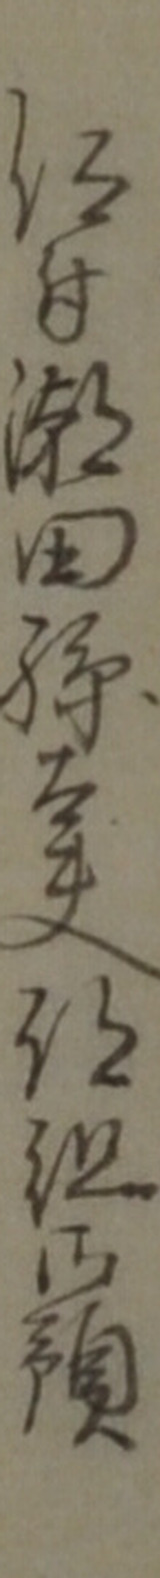仰付瀬田孫太夫跡組御預
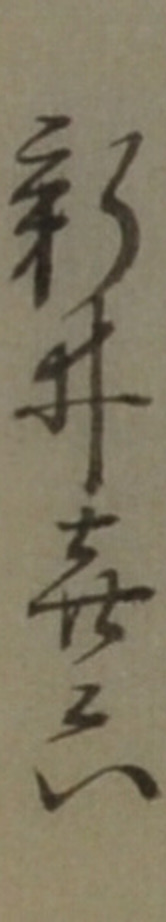新井喜六
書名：諸御役代々録（二）
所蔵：伊那市立高遠町図書館・合同会社AMANE
